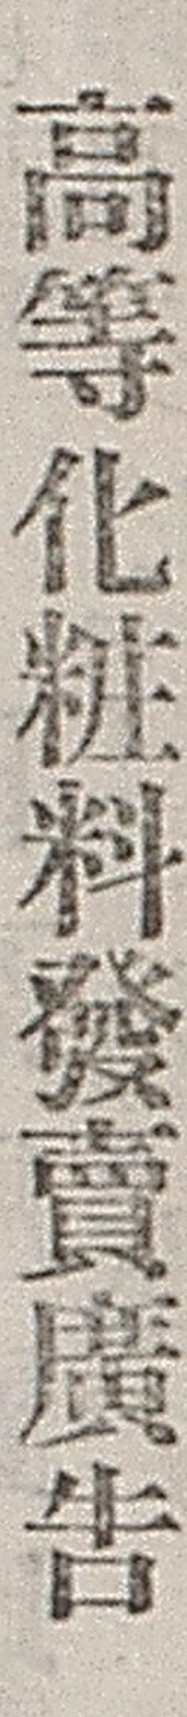高等化粧料発売広告
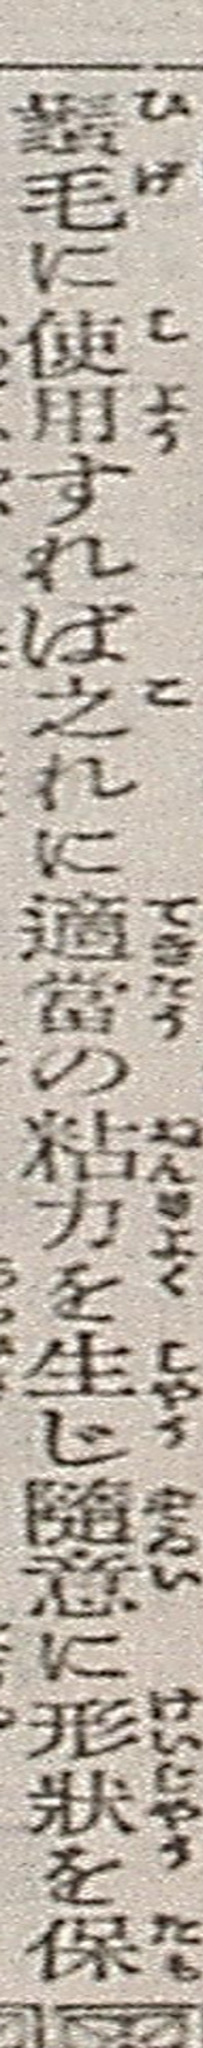髭毛に使用すれば之れに適当の粘力を生じ随意に形状を保
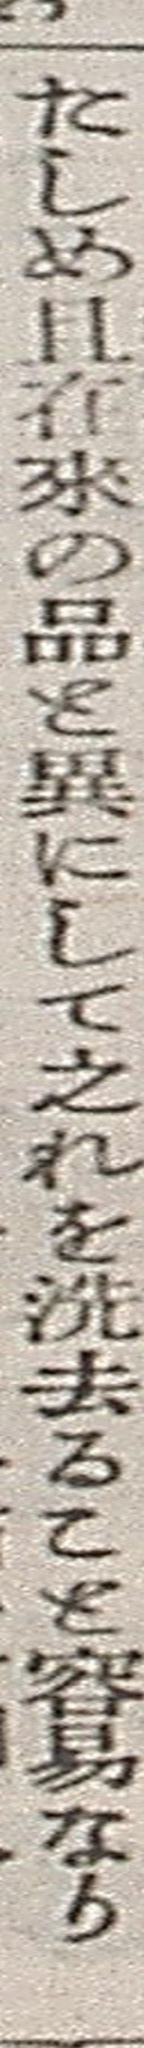たしめ且在来の品と異にして之れを洗去ること容易なり
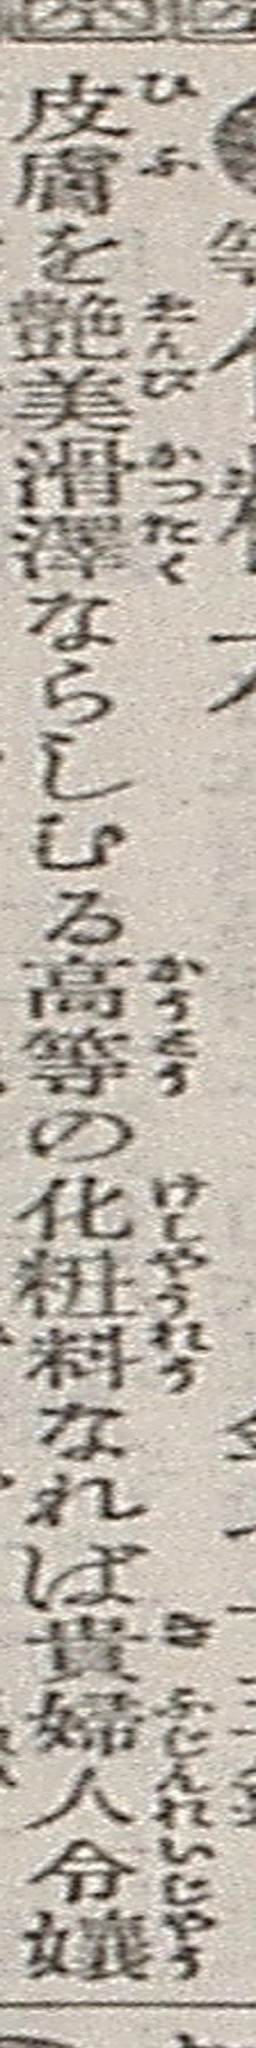皮膚を艶美滑沢ならしむる高等の化粧料なれば貴婦人令嬢
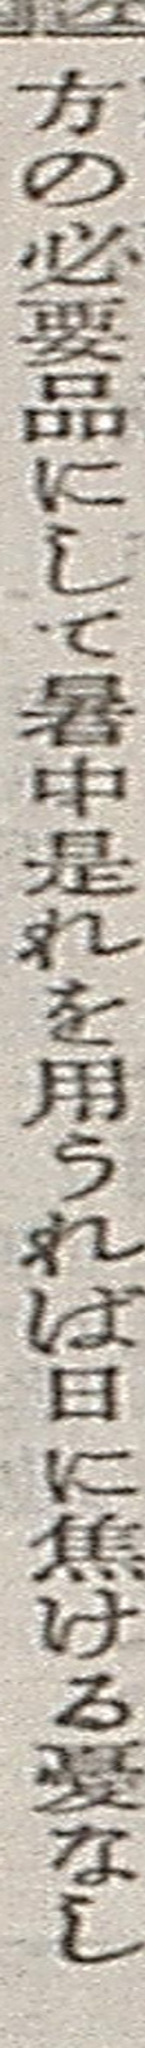方の必要品にして暑中是れを用うてば日に焦ける憂なし
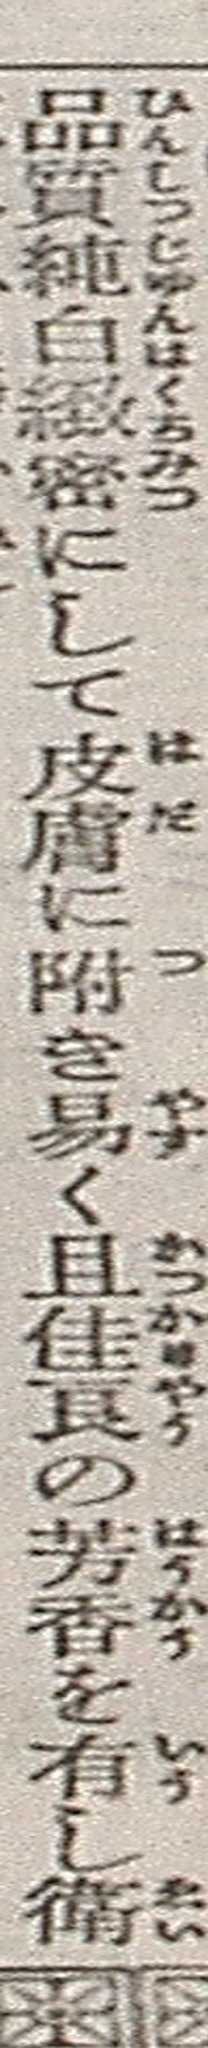品質純白緻密にして皮膚に附き易く且佳良の芳香を有し衛
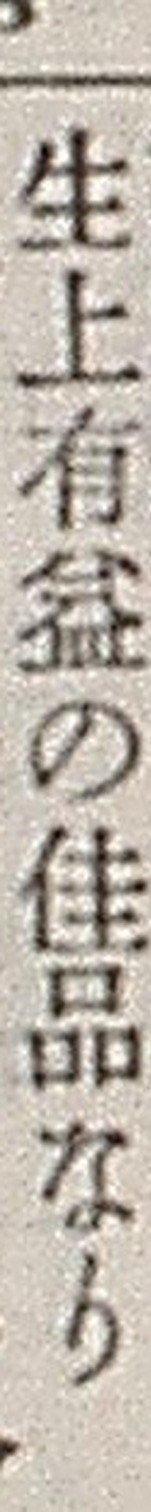生上有益の佳品なり
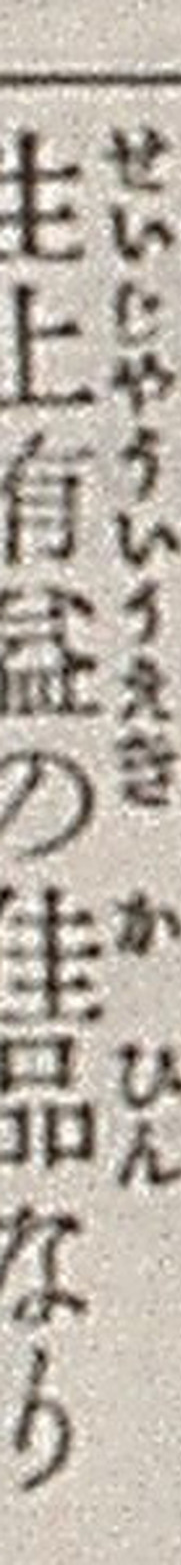生上有益の佳品なり
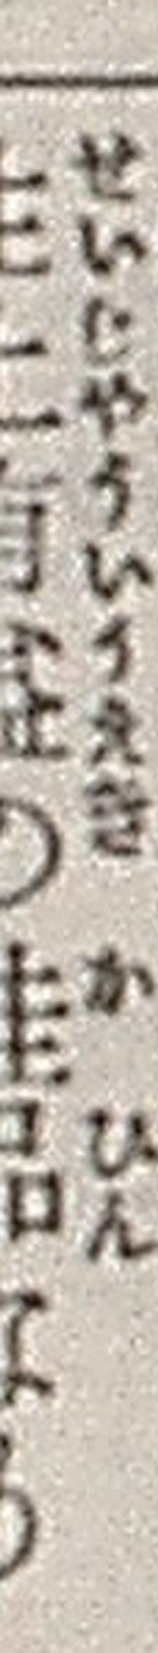生上有益の佳品なり
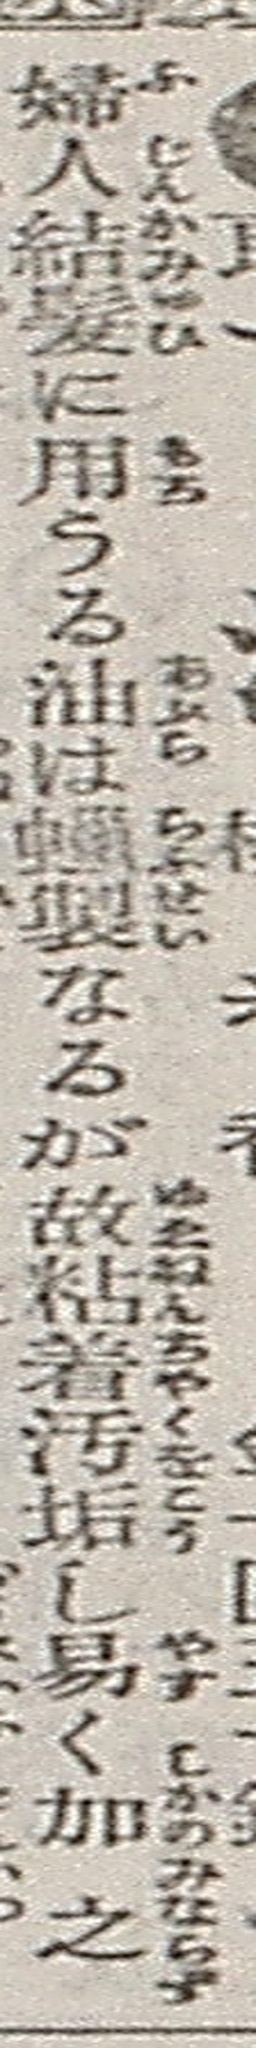婦人髪結に用うる油は蠟製なるが故粘着汚垢し易く加之
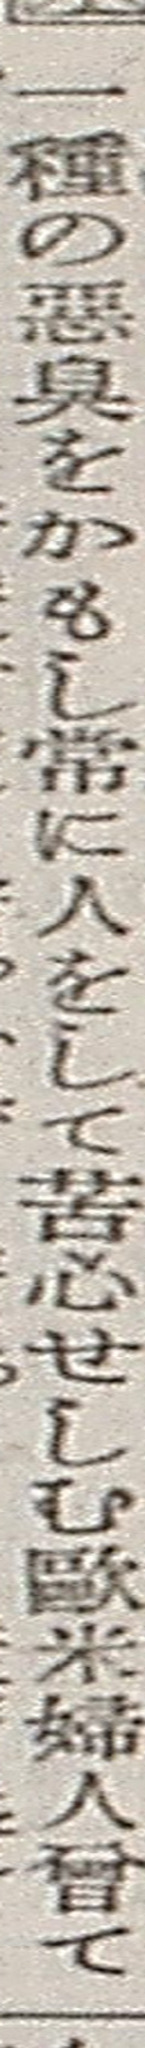一種の悪臭をかもし常に人をして苦心せしむ欧米婦人曾て
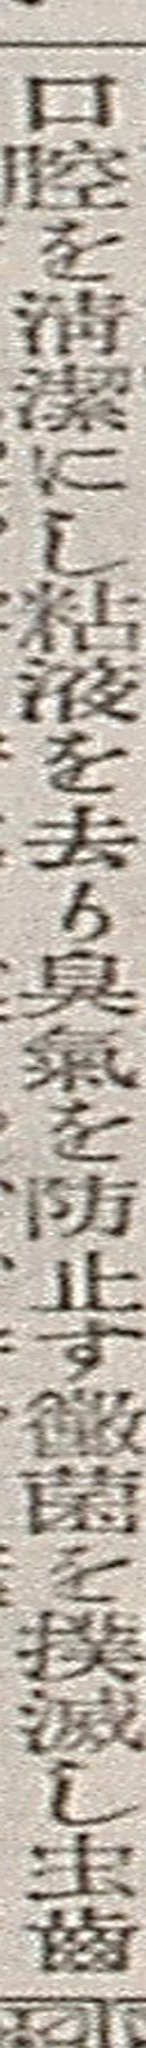口腔を清潔にし粘液を去り臭気を防止す黴菌を撲滅し虫歯
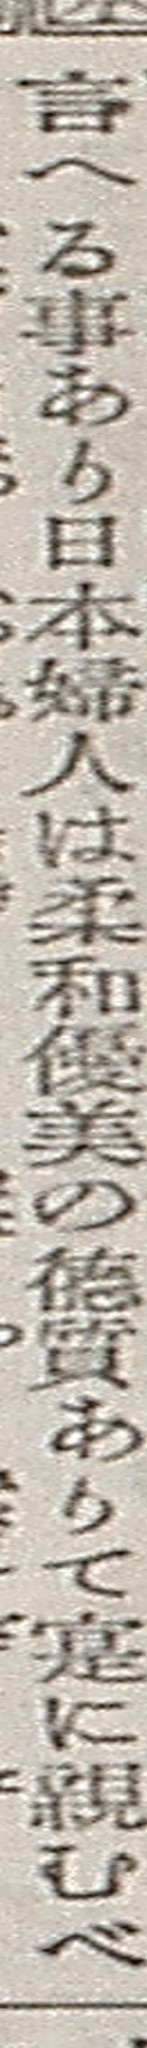言へる事あり日本婦人は柔和優美の徳質ありて寔に親むべ
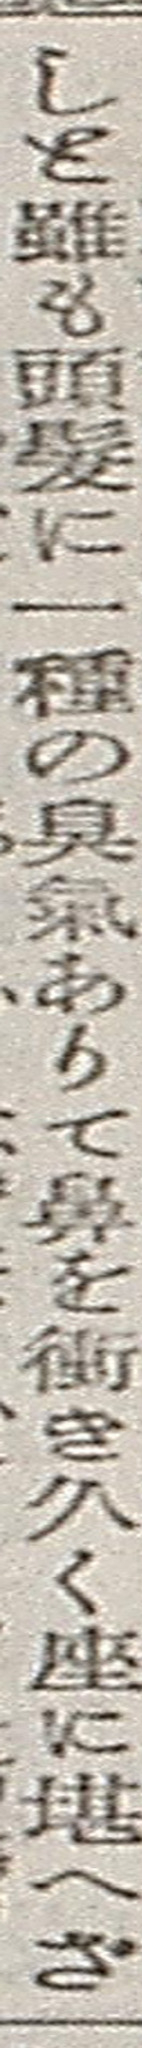しと雖も頭髪に一種の臭気ありて鼻を衝き久く座に堪へざ
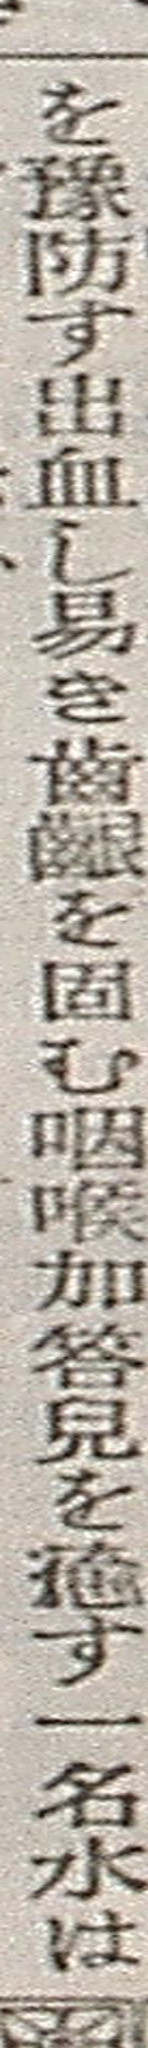を予防す出血し易き歯茎を固む咽喉加答児を癒す一名水は
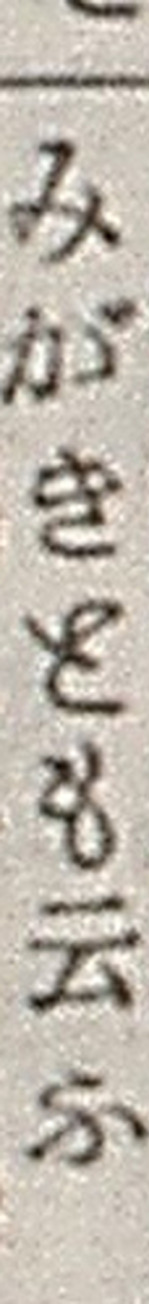みがきとも云ふ
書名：風俗畫報臨時増刊第百九十九號　明治三十二年十月各地災害圖會（前編之續）
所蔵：東京大学地震研究所図書室 Earthquake Research Institute Library, The University of Tokyo, JAPAN
